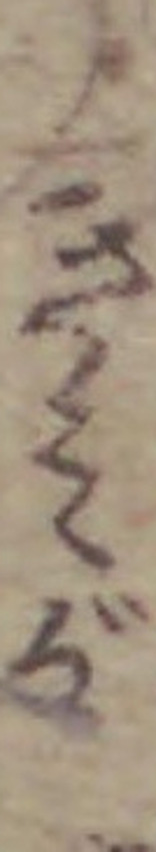きみが
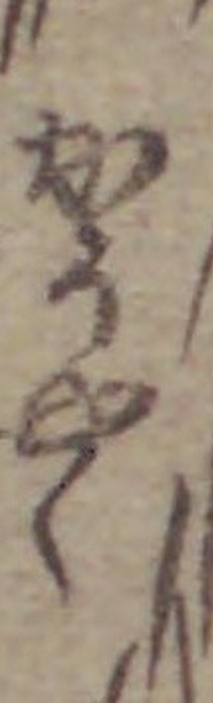かうやく
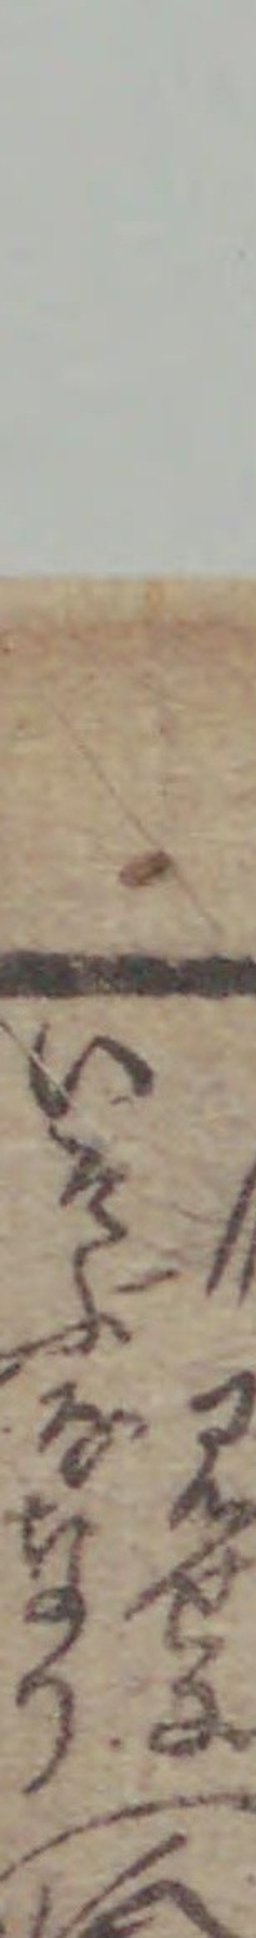いそふななり
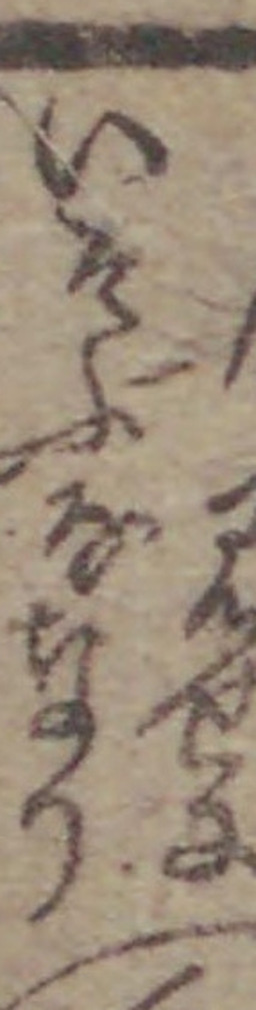いそふななり
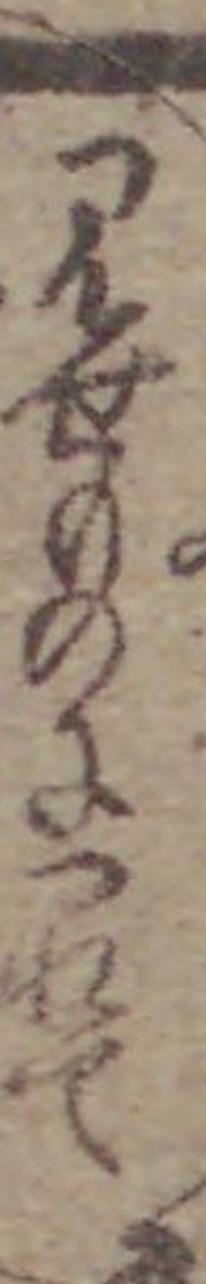みせものにつれて
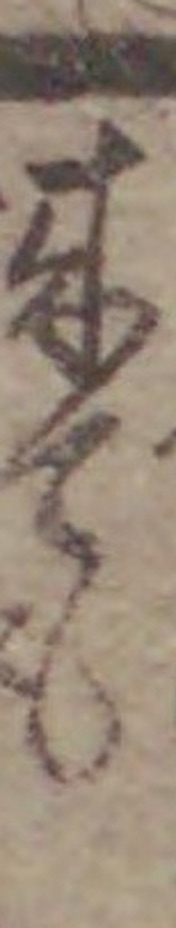来ても
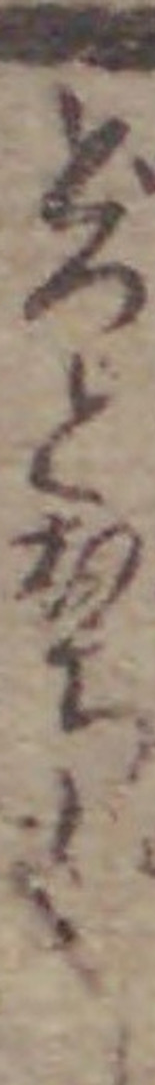どつとおちも
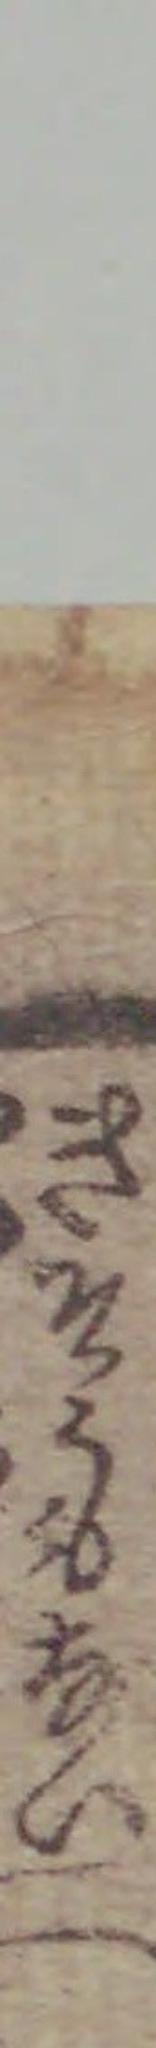きそうもない
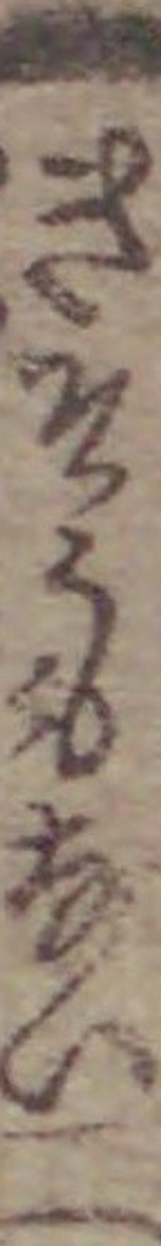きそうもない
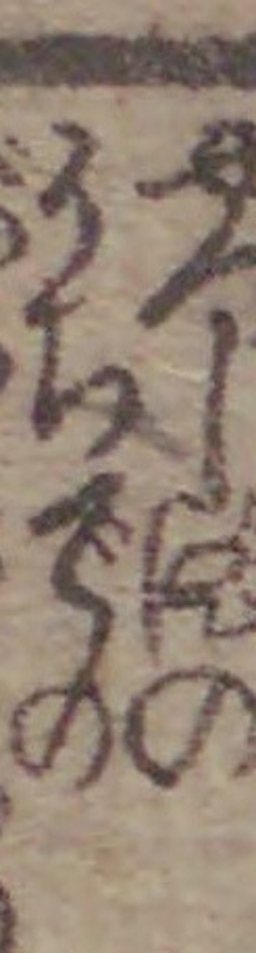うちでの
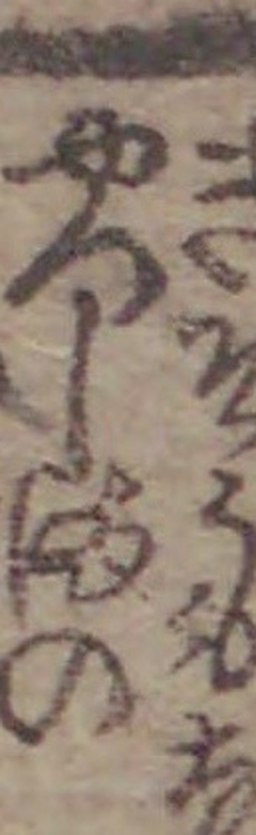やつしまの
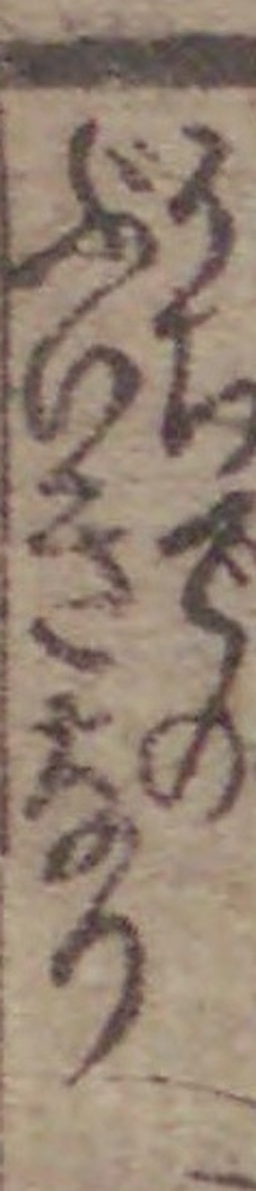ぶいきなり

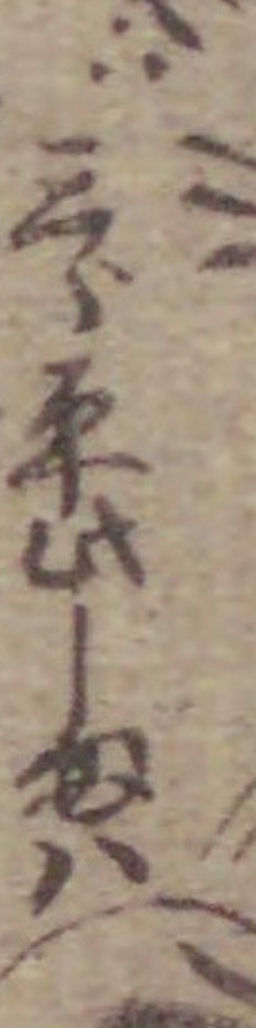三郎平此しまは
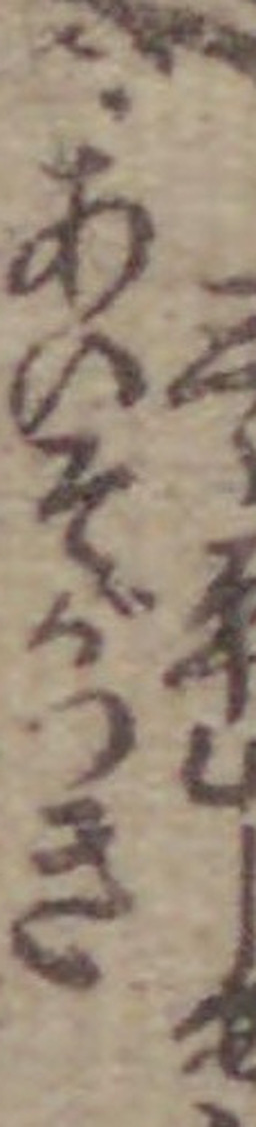あいそがつき
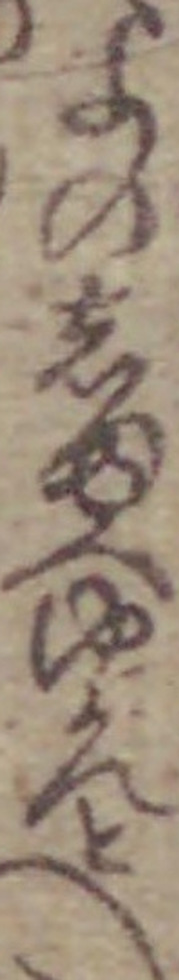よのしまへゆかんと
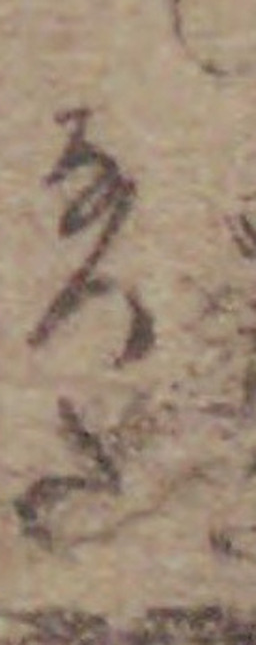なつた
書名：近頃嶋めぐり 3巻
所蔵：国立国会図書館 National Diet Library, JAPAN
